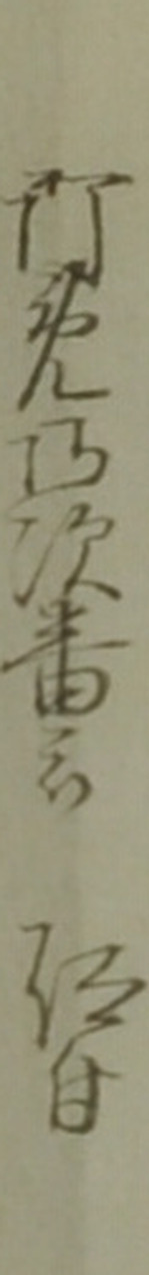御免御次番被仰付
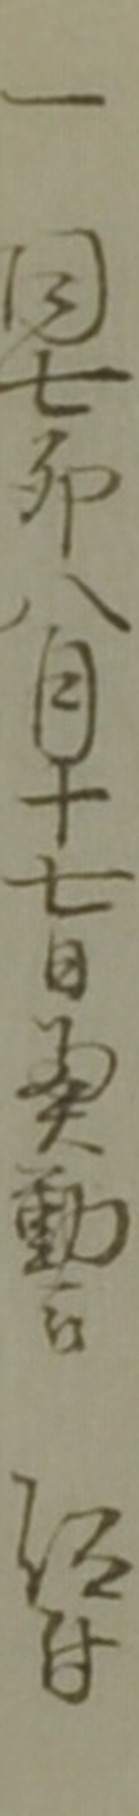一同七卯八月十七日奥勤被仰付
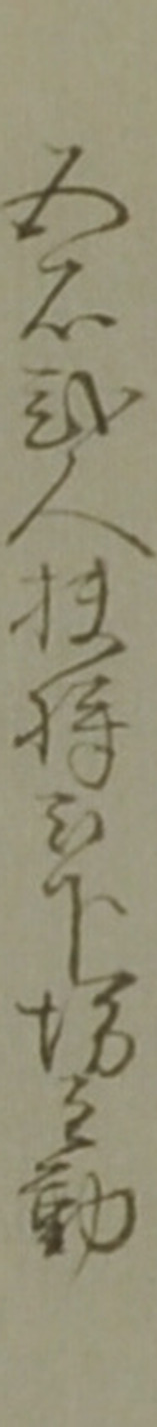五石弐人扶持被下坊主勤
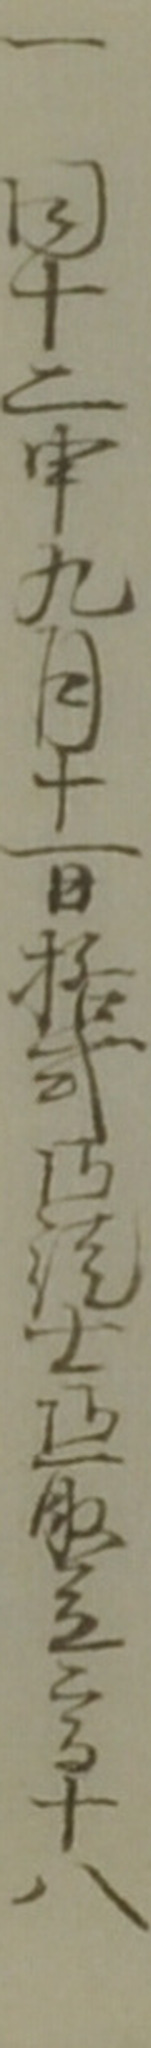一同十二申九月十一日格式御徒士御取立高十八
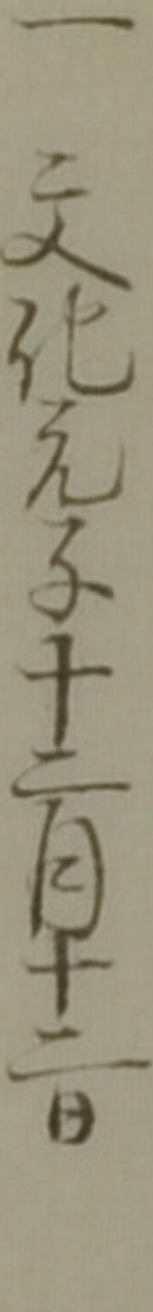一文化元子十二月十二日
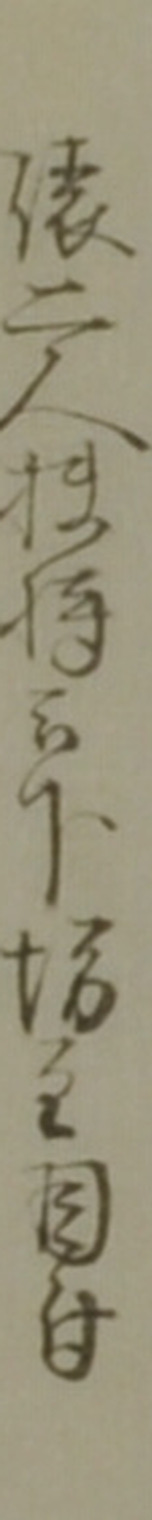俵二人扶持被下坊主目付
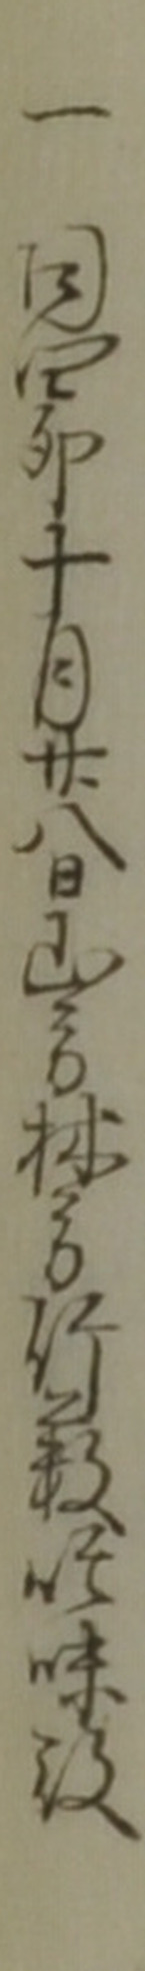一同四卯十一日廿八日山方林方竹薮吟味役
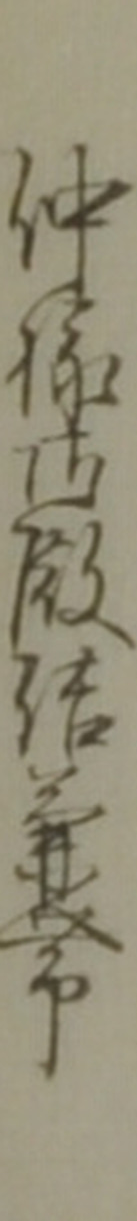仲様御殿詰兼帯
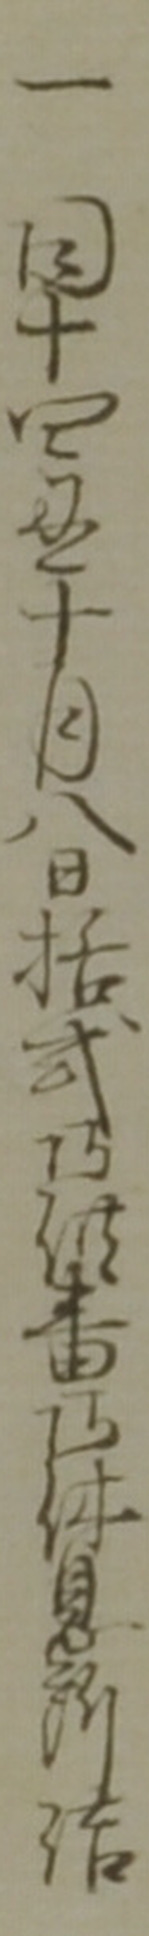一同十四丑十月八日格式御供番御休息所詰
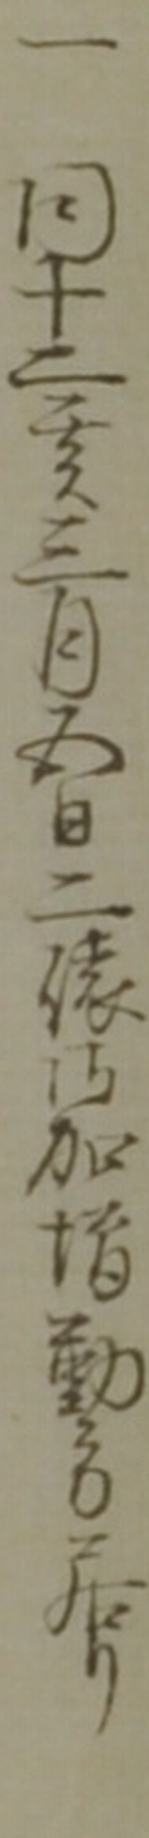一同十二亥三月五日二俵御加増勤方居リ
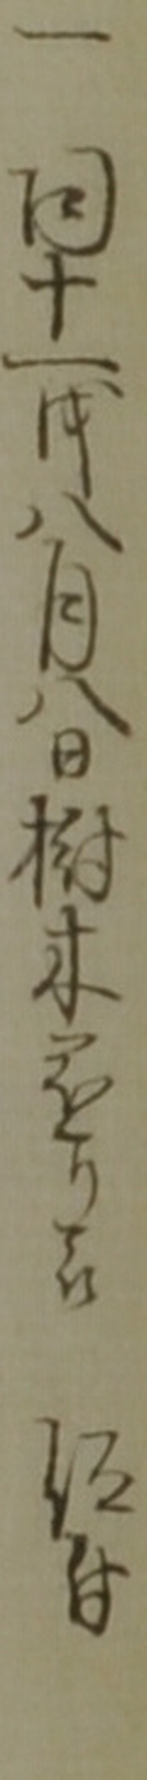一同十一戌八月八日樹木懸リ被仰付
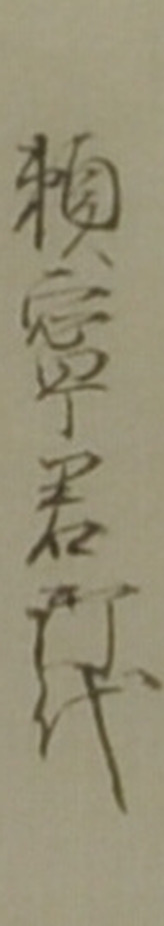頼寧君御代
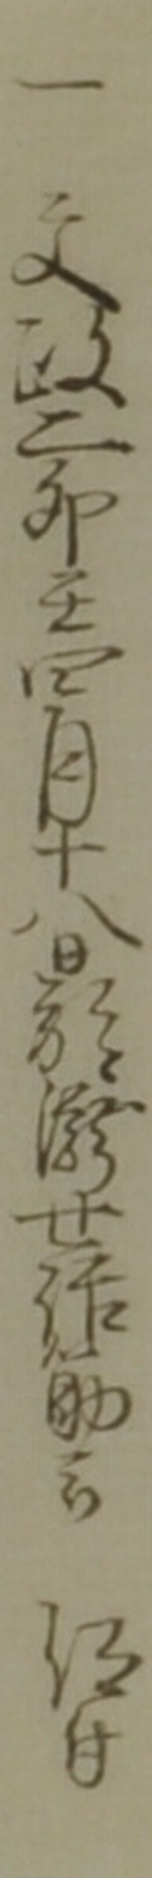一文政二卯閏四月十八日於瀧世話筋被仰付
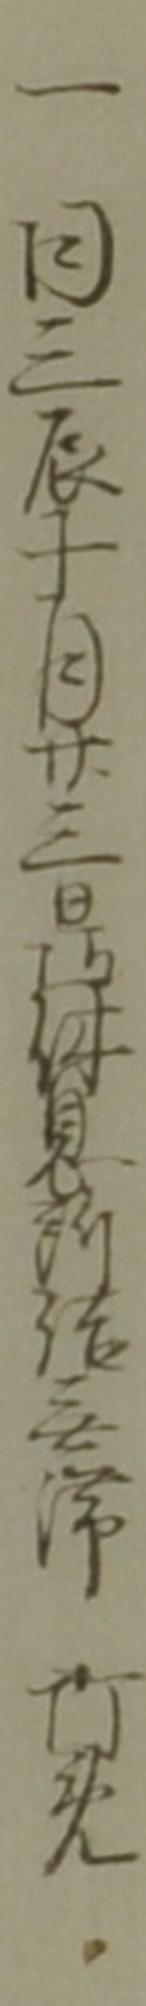一同三辰十月廿三日御休息所詰無滞御免
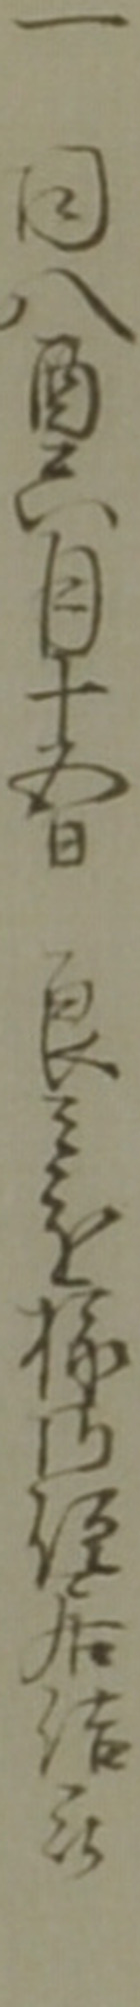一同八酉六月十五日良之進様御住居詰被
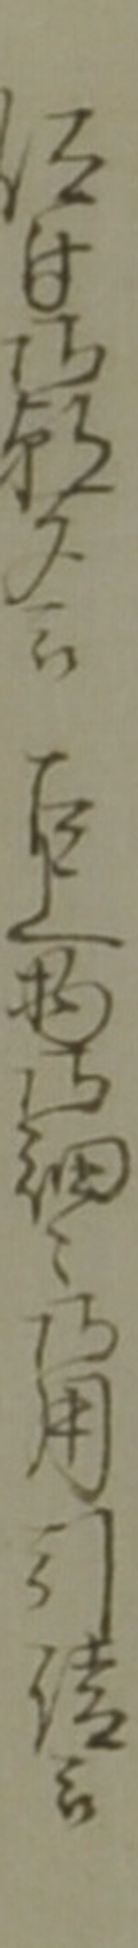仰付御朝夕被召上物御細々御用引請被
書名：無足諸士勤仕録（五）
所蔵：伊那市立高遠町図書館・合同会社AMANE
